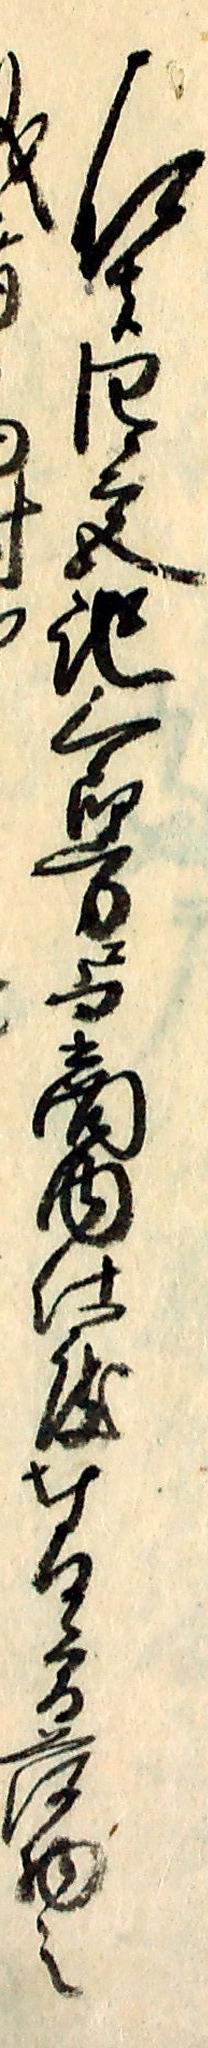右は四ッ宮記三郎方にて商内仕度奉存候間荷物之
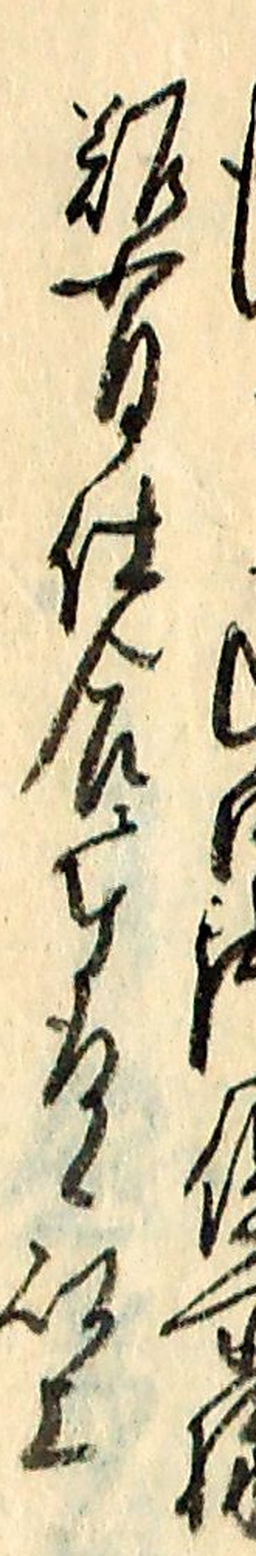難有仕合に奉存候以上
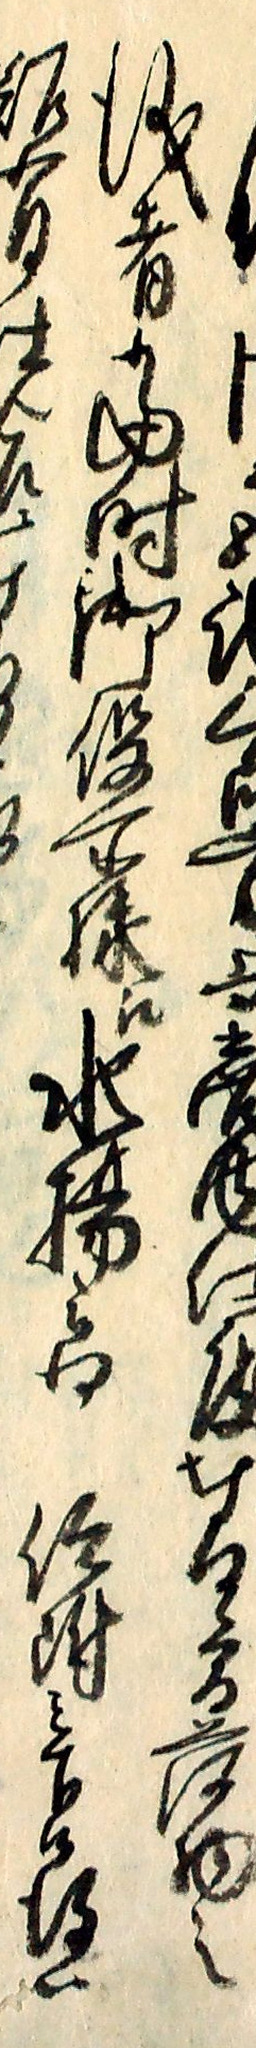儀は当時御役所様え水揚被為仰附被下候得は
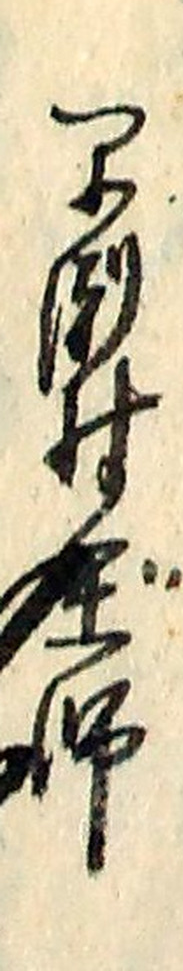早淵村玉師
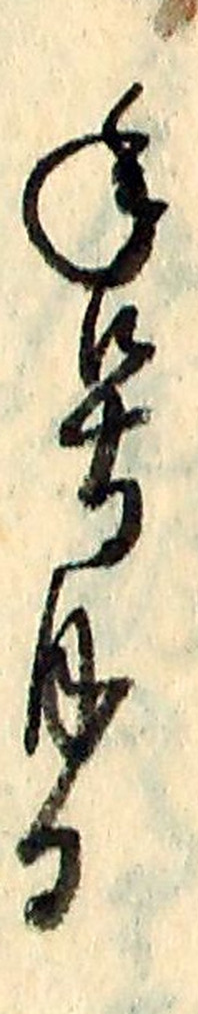年号月日
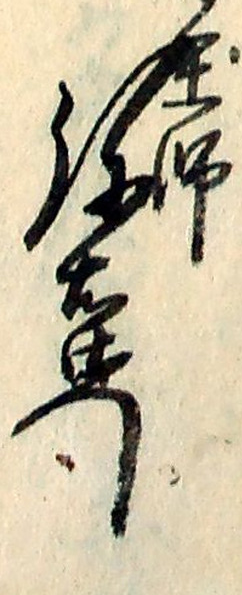弥右衛門
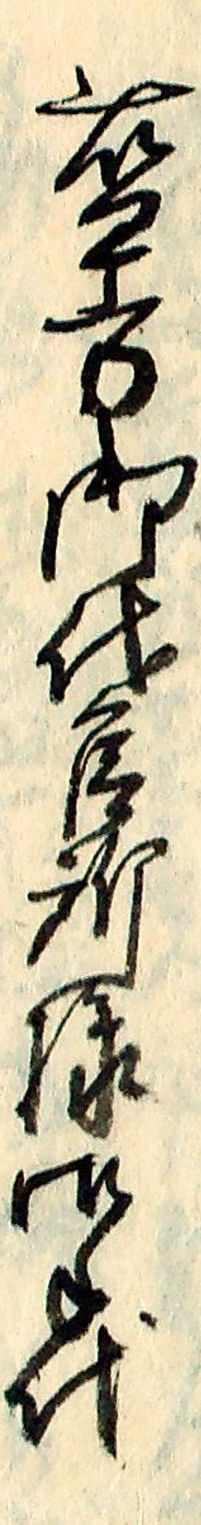藍方御代官所様御手代
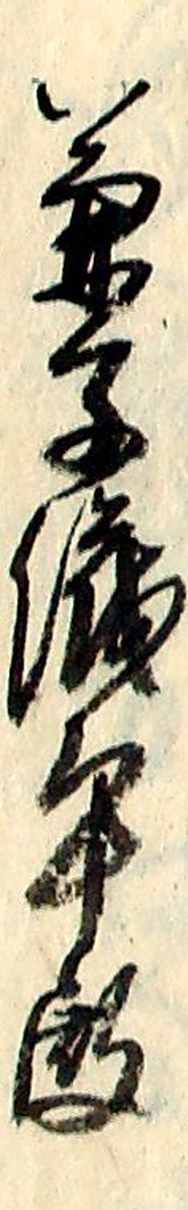兼子儀平殿

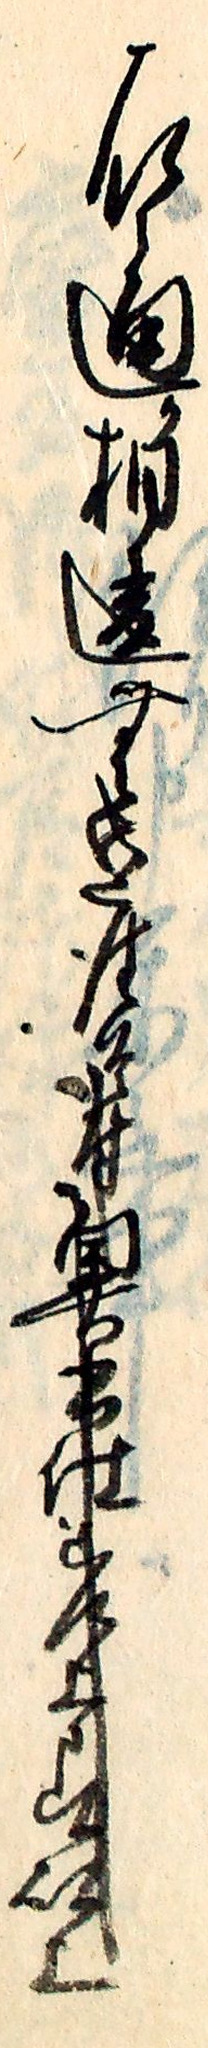右之通り相違無御座候「に付奥書仕差上申候以上」
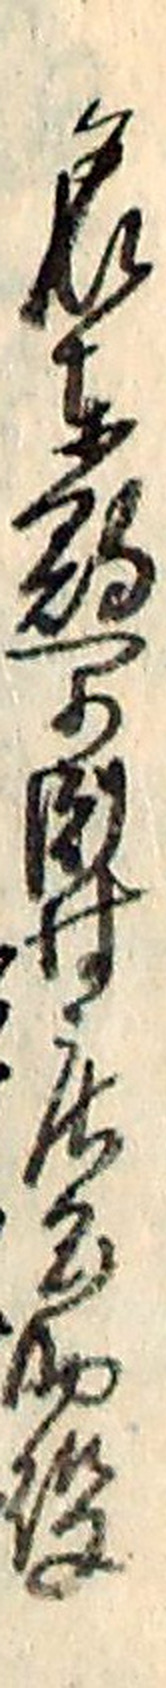名東郡早淵村庄屋助役
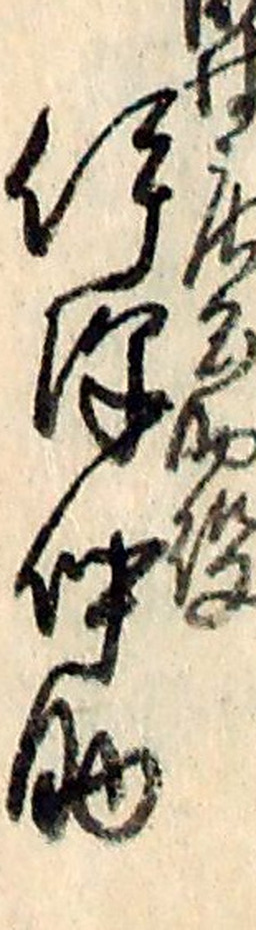伊沢仲助
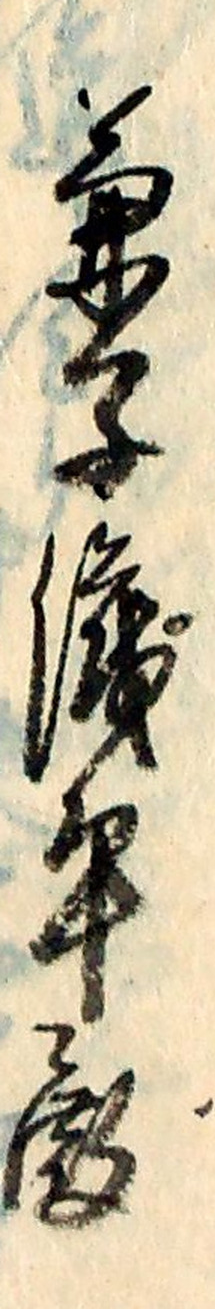兼子儀平殿

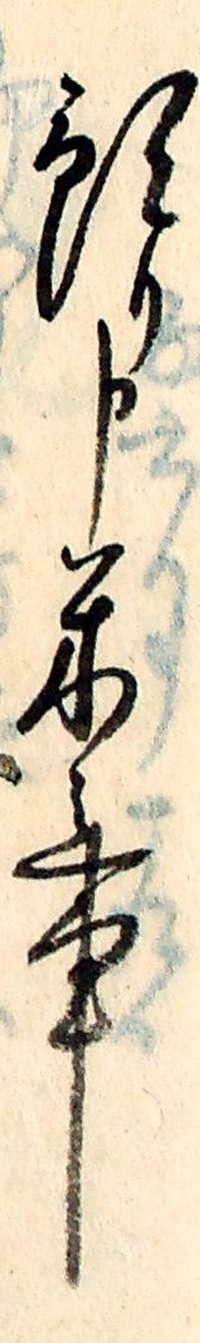預り申米之事
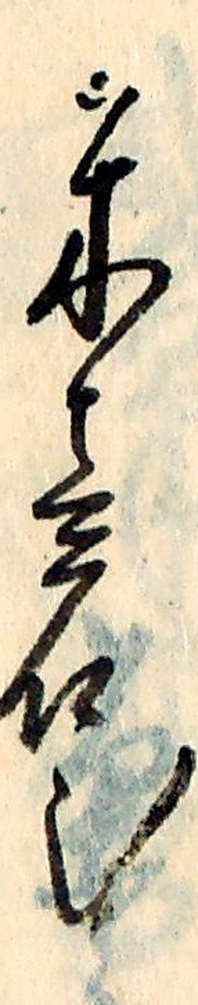一米壱石也
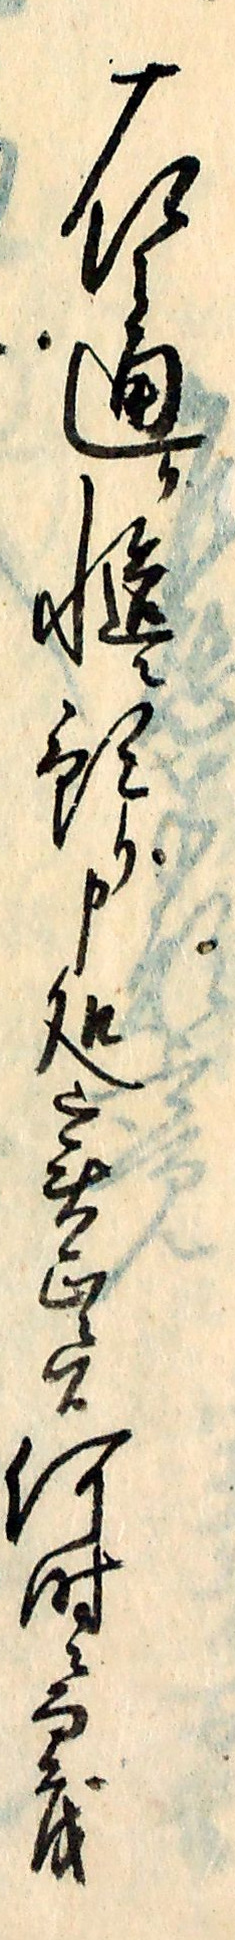右之通り慥に預り申処実正に候何時にても
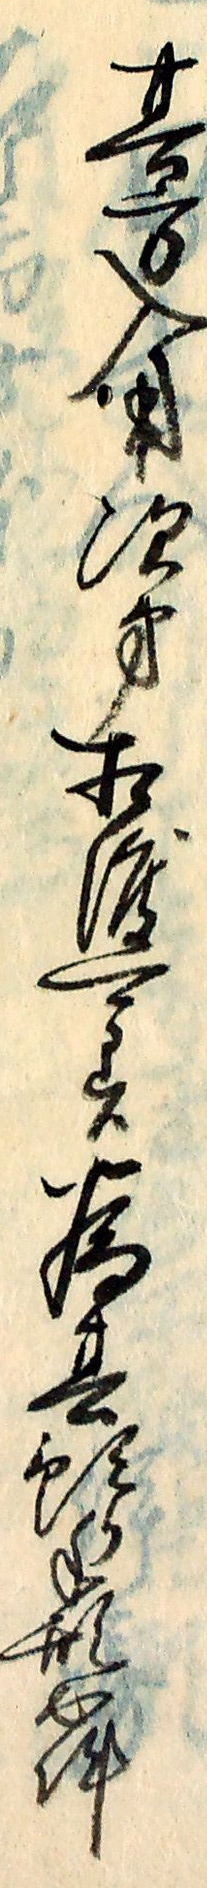其方入用次第相渡可申候為其預り手形如件
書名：諸御願書控(後藤氏壱番）
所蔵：鳴門教育大学 Naruto University of Education
